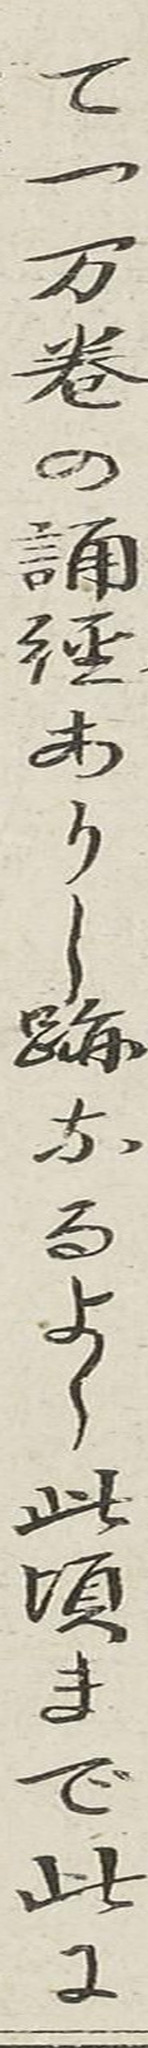て一万巻の誦経ありし跡なるよし此頃まで此に
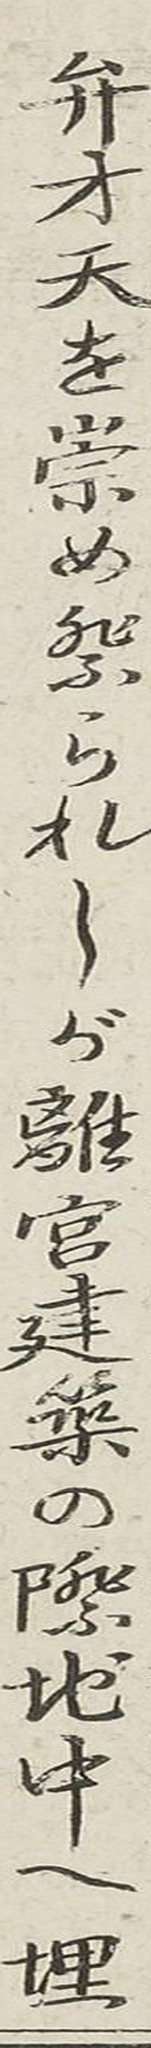弁才天を崇め祭られしが離宮建築の際地中へ埋
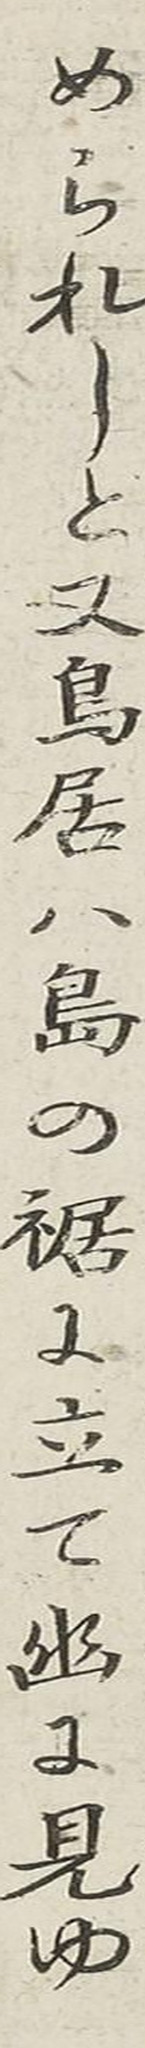められしと又鳥居は島の裾に立て幽に見ゆ
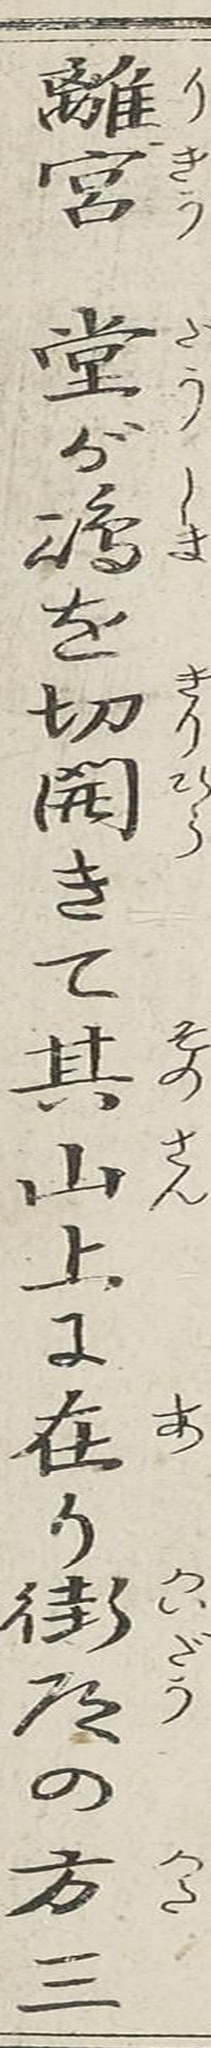離宮堂が嶋を切開きて其山上に在り街道の方三
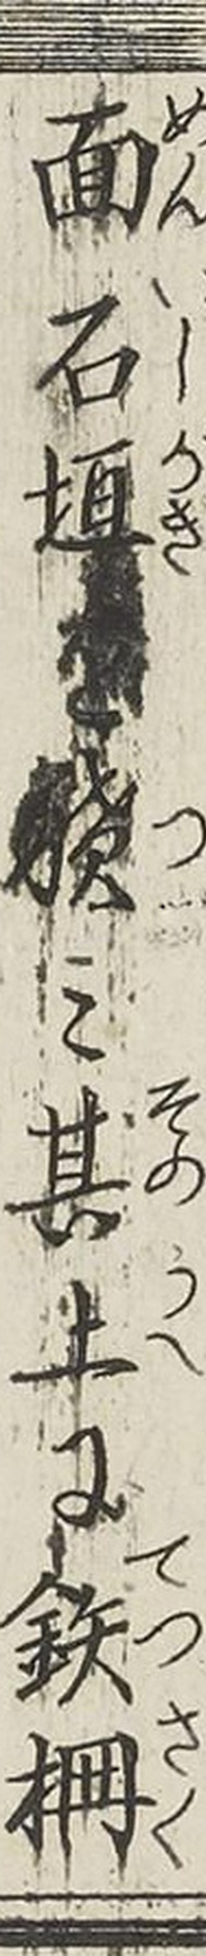離面石垣を積み其上に鉄柵
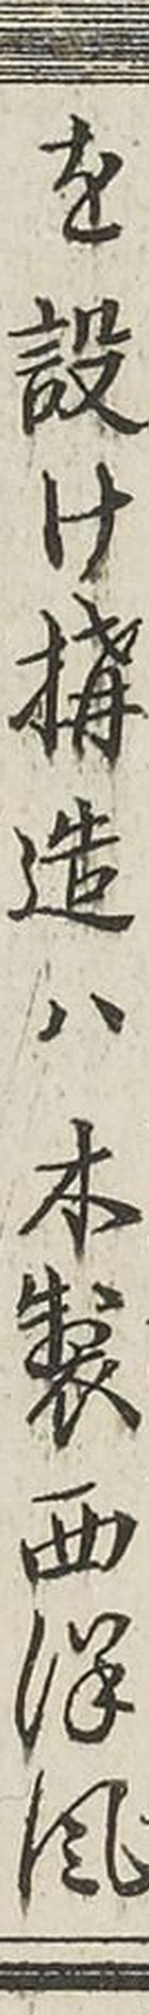宮を設け構造は木製西洋風
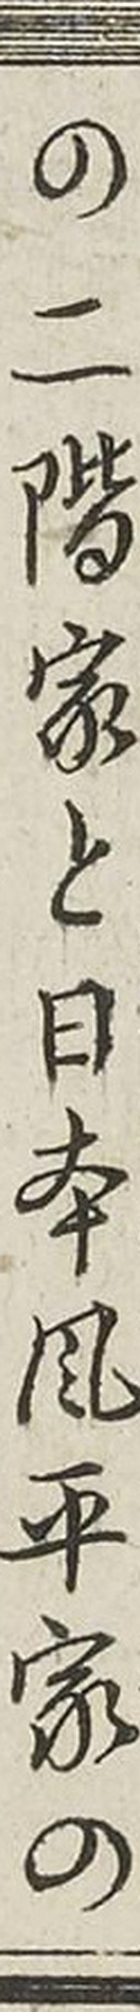之の二階屋と日本風平屋の
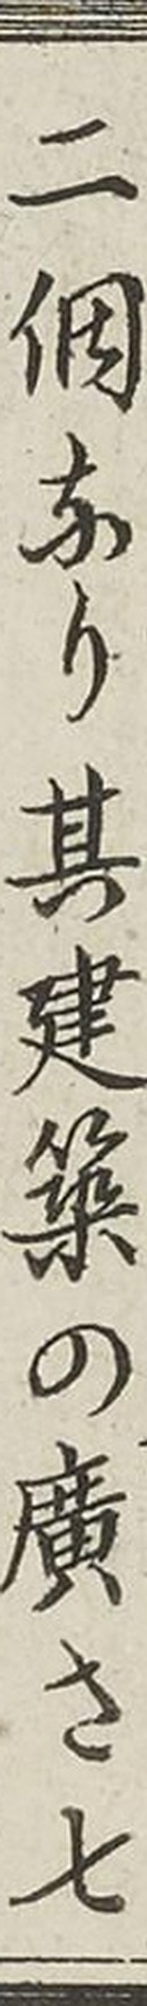圖二個なり其建築の廣さ七
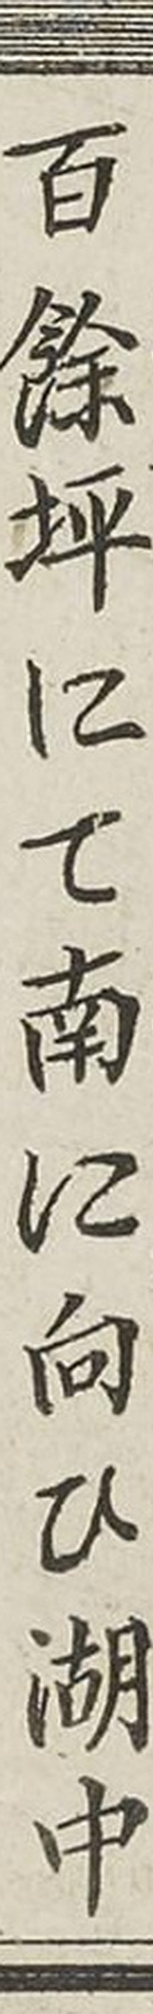百餘坪にて南に向ひ湖中
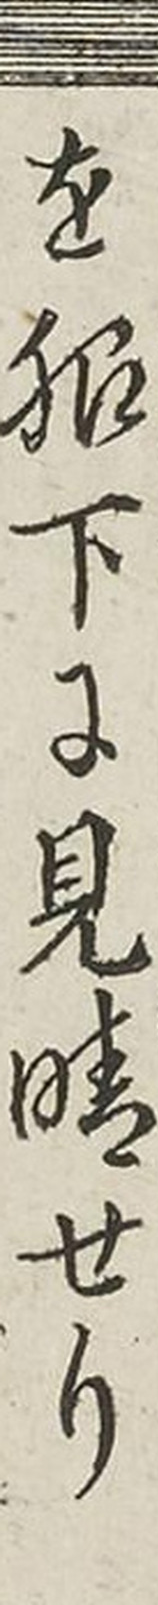を眼下に見晴せり
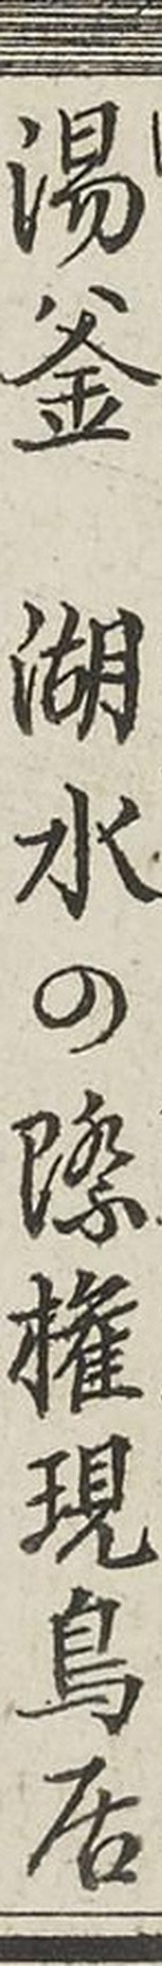湯釡湖水の澤権現鳥居
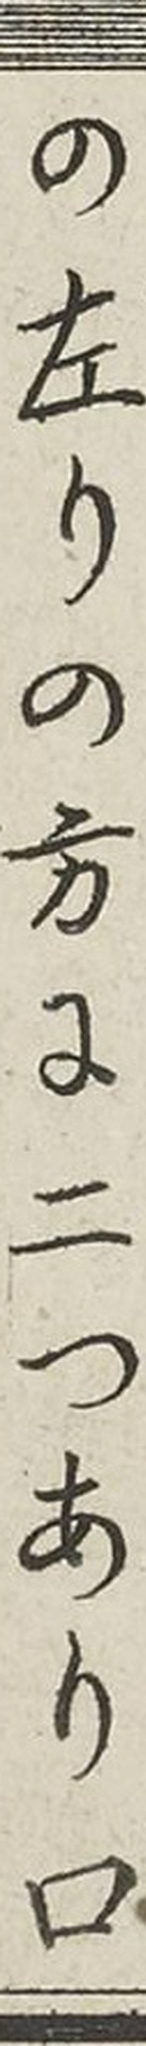の左りの方に二つあり口
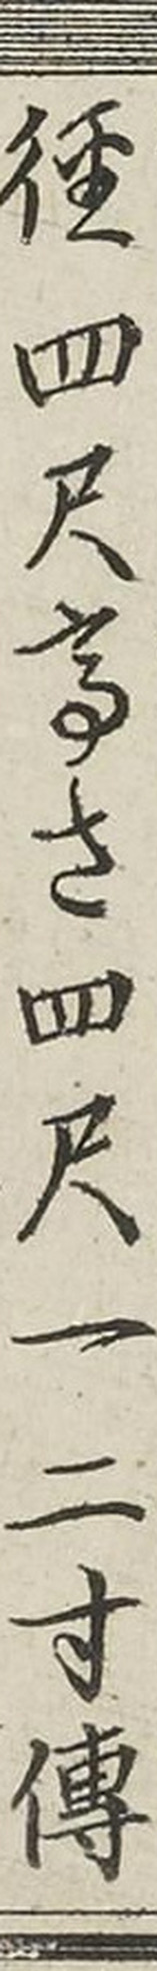径四尺高さ四尺一二寸傳
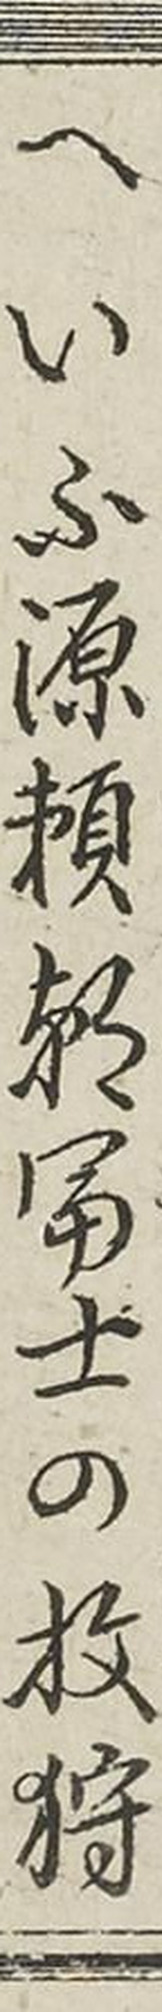へいふ源頼朝富士の牧狩

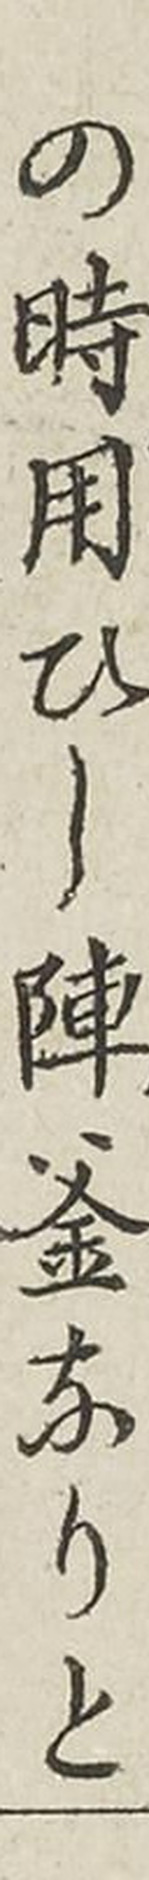の時用ひし陣釜なりと
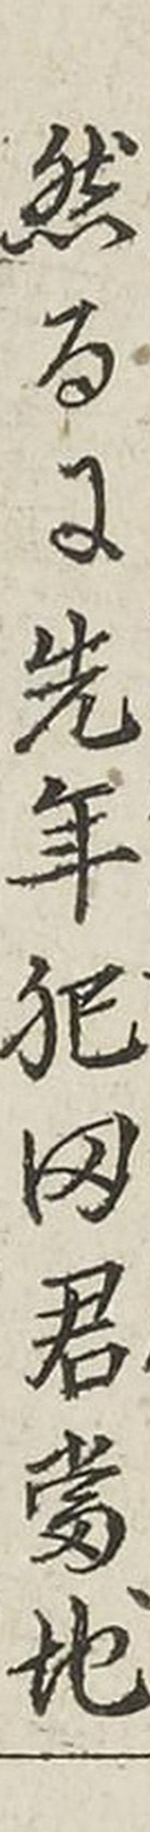然るに先年肥田君當地
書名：箱根温泉誌　全
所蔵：東京大学地震研究所図書室 Earthquake Research Institute Library, The University of Tokyo, JAPAN
